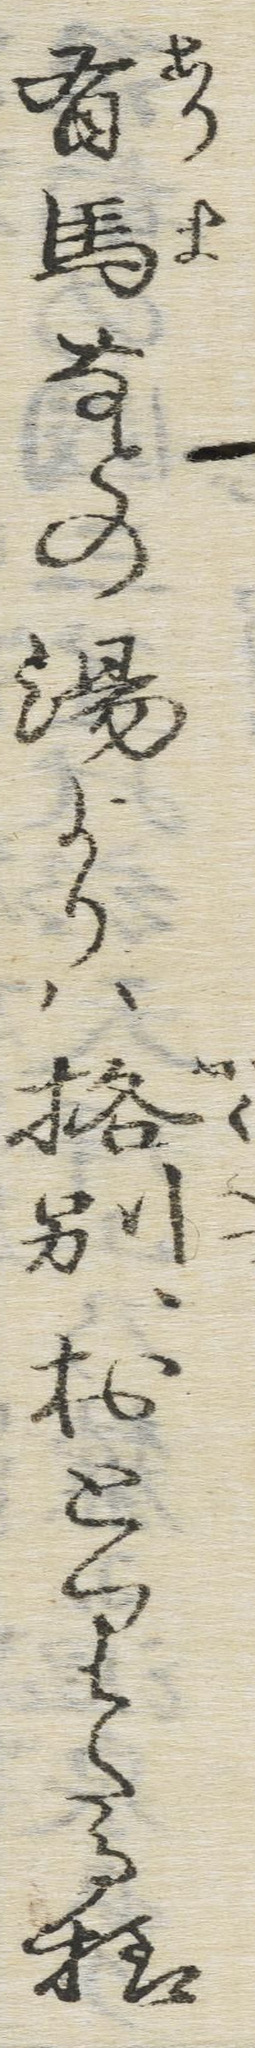有馬なとの湯よりは格別おとりたる様
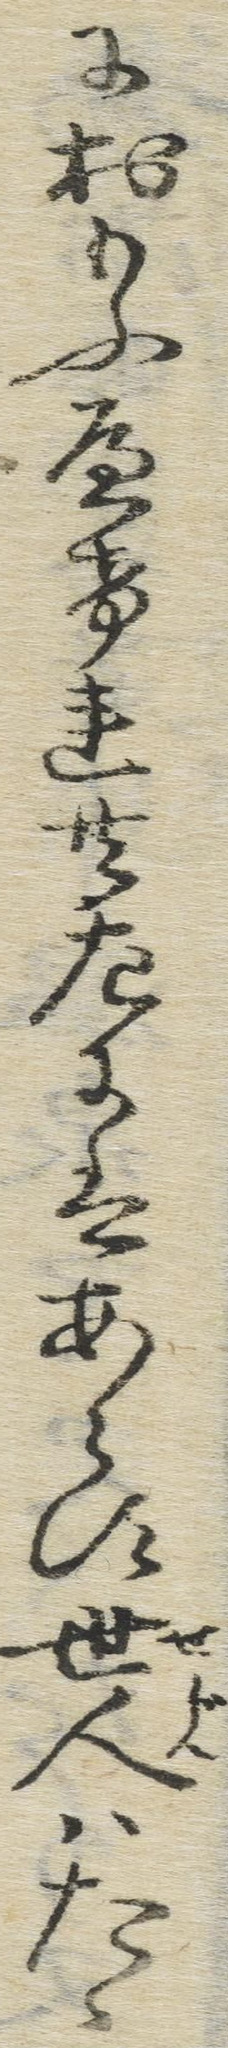におもふへけれ共さにはあらす世人はたゝ
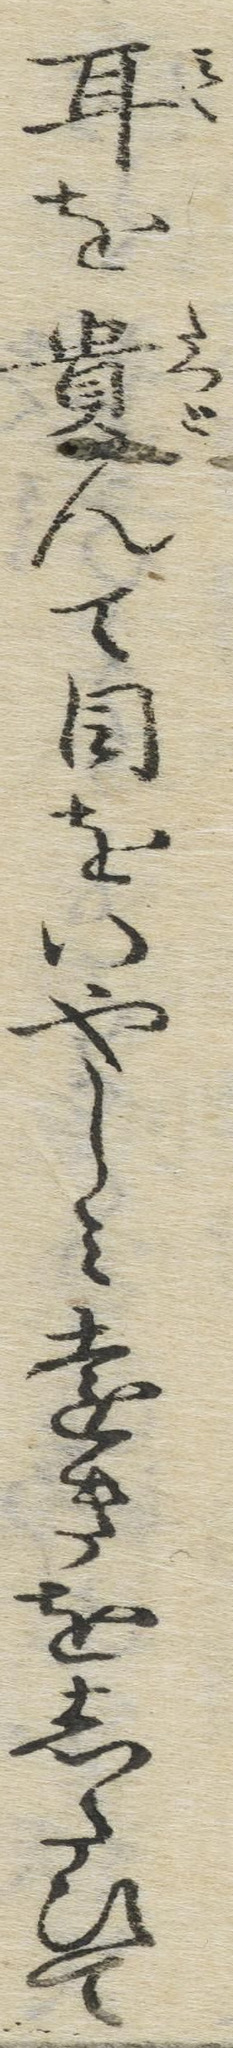耳を貴んて目をいやしみ遠きをしたひて
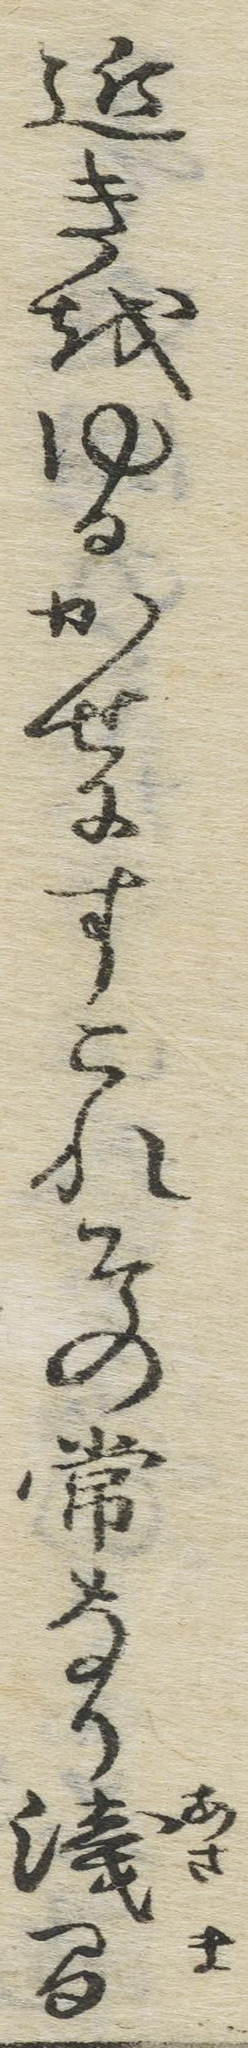近きをゆるかせにすこれその常なり浅間
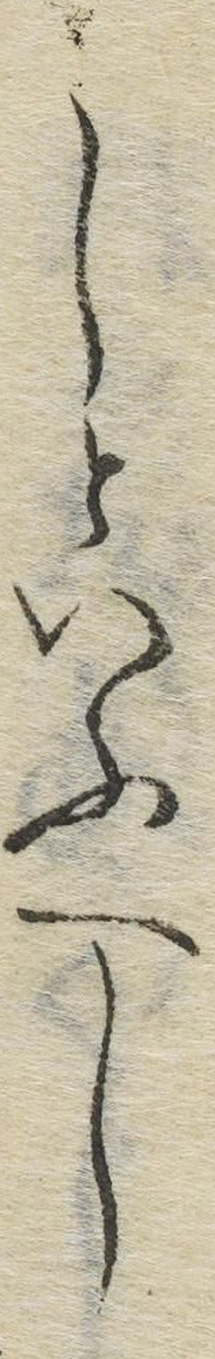しといふへし
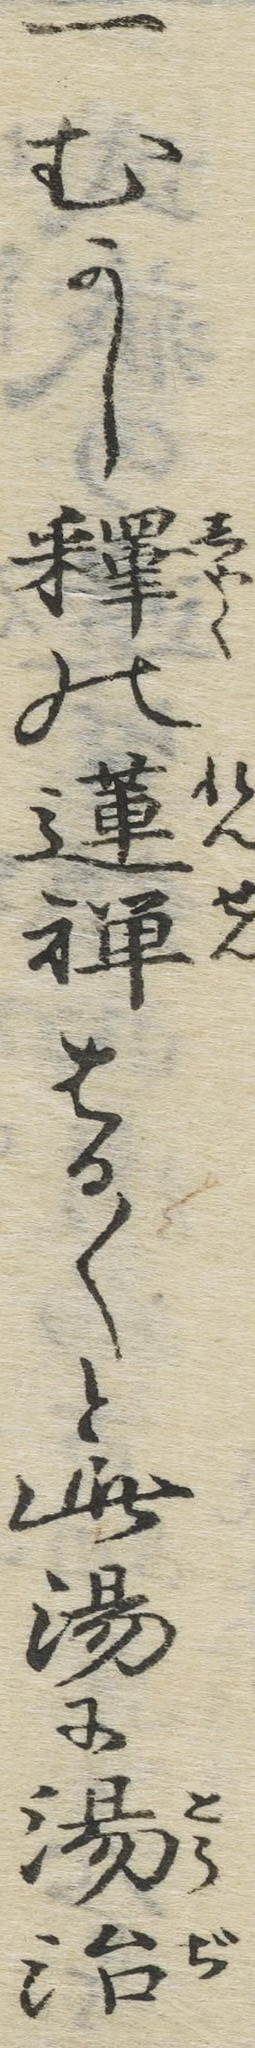一むかし釈の蓮禅はる〳〵と此湯に湯治
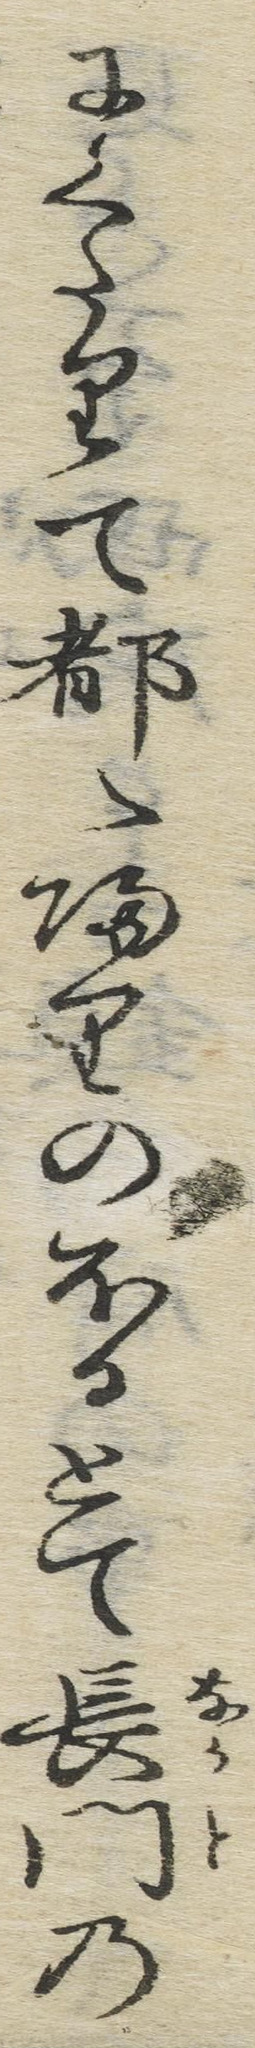にくたりてとゝまりのほるとて長門の
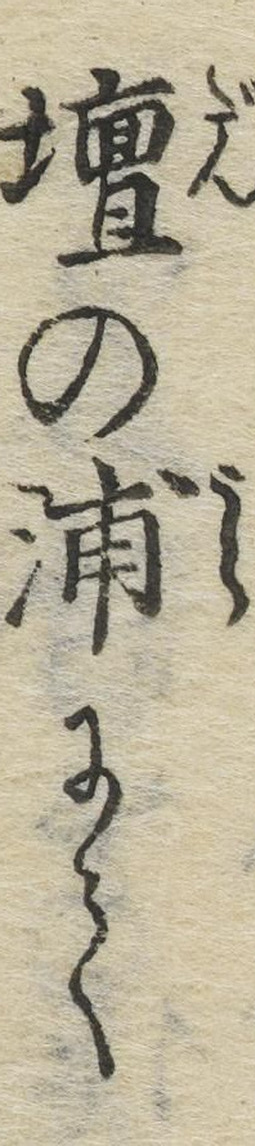壇の浦にて

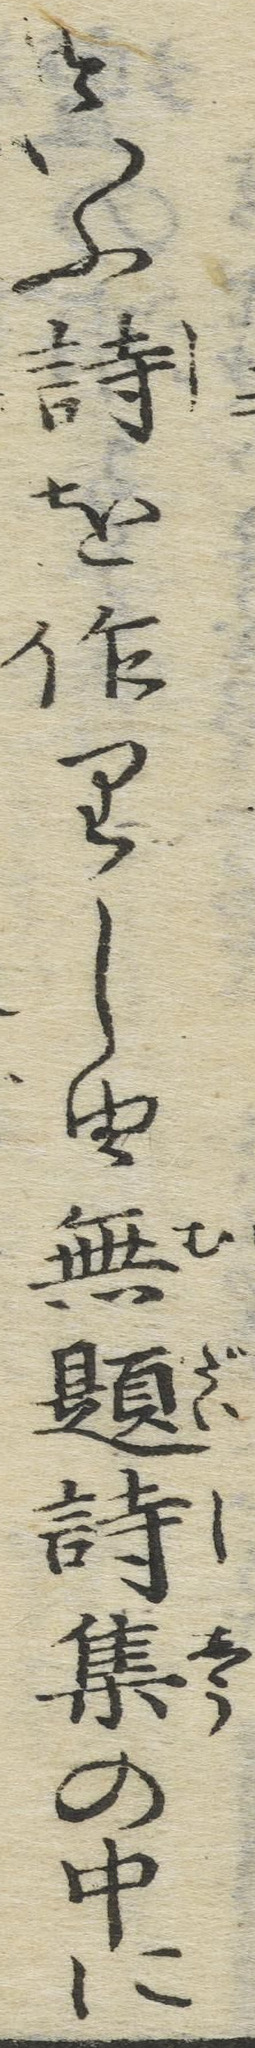といふ詩を作りし由無題詩集の中に
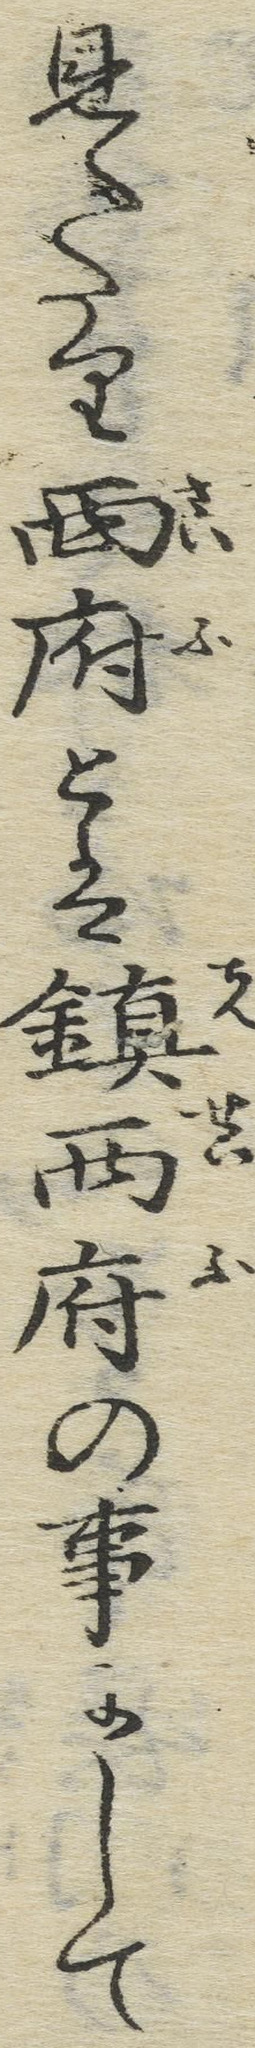見へたり西府とは鎮西府の事にして
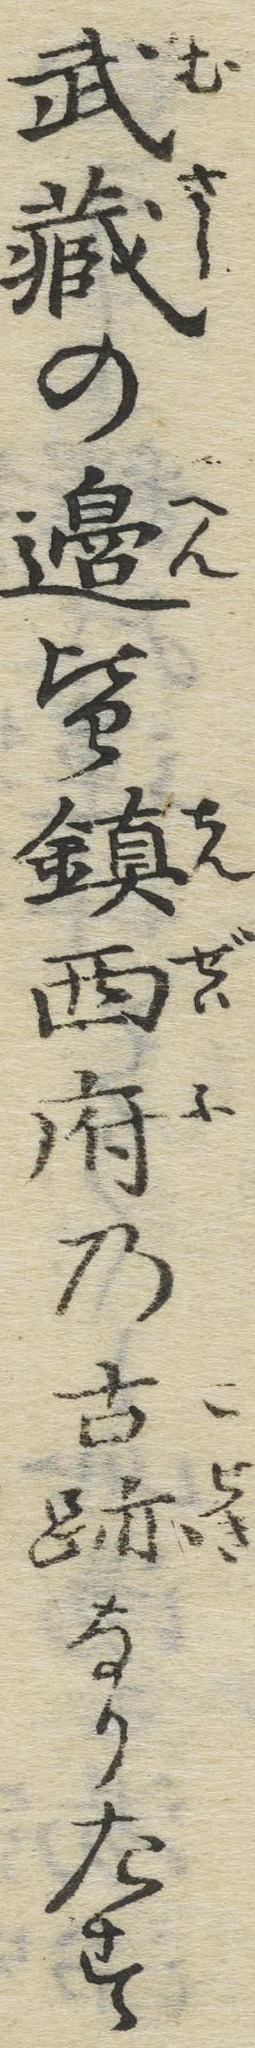武蔵の辺皆鎮西府の古跡なりさす
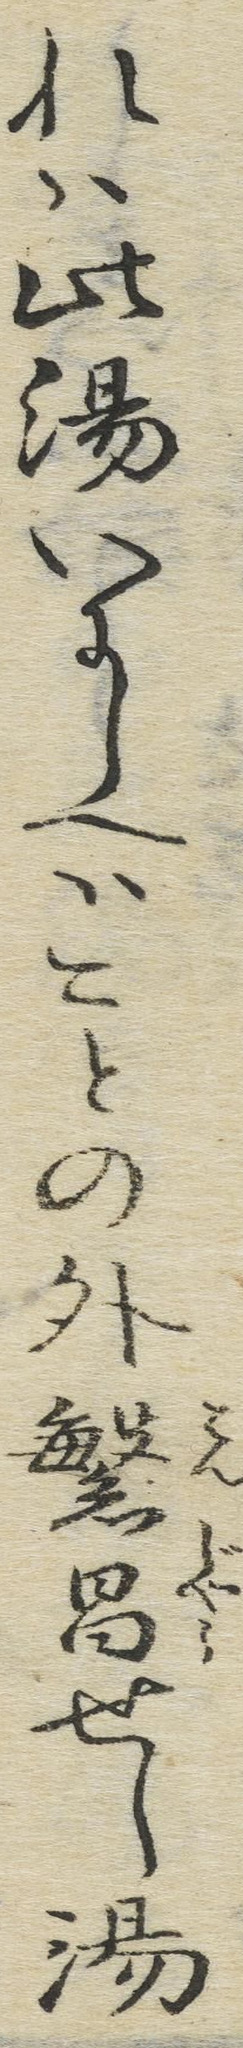れは此湯いにしへはことの外繁昌せし湯
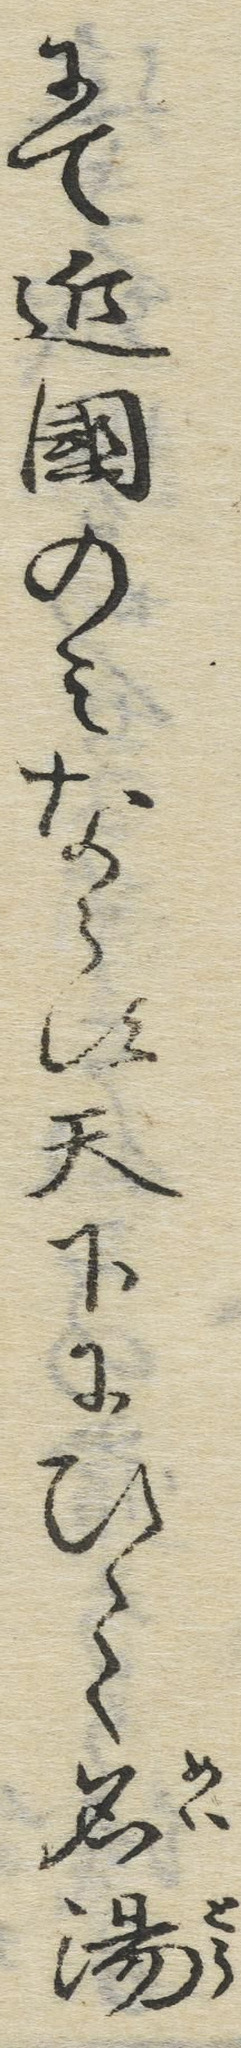にて近国のみならす天下にひゝく名湯
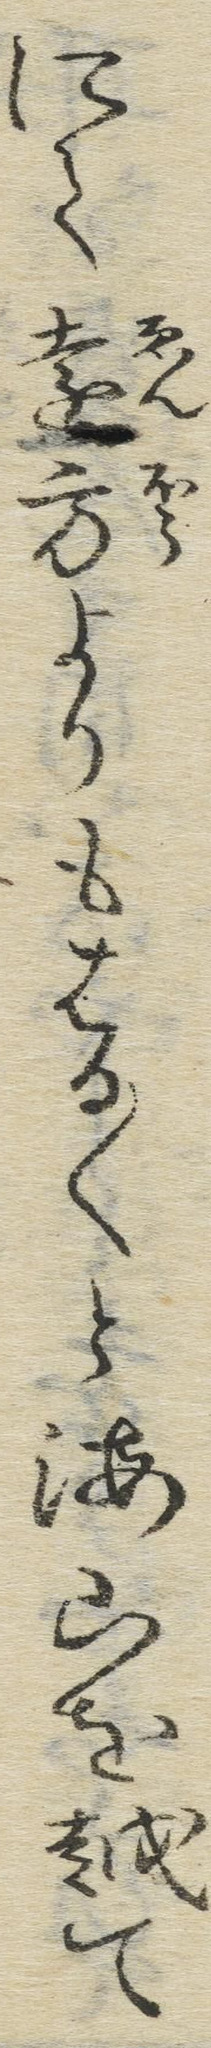にて遠方よりもはる〳〵と海山を越て
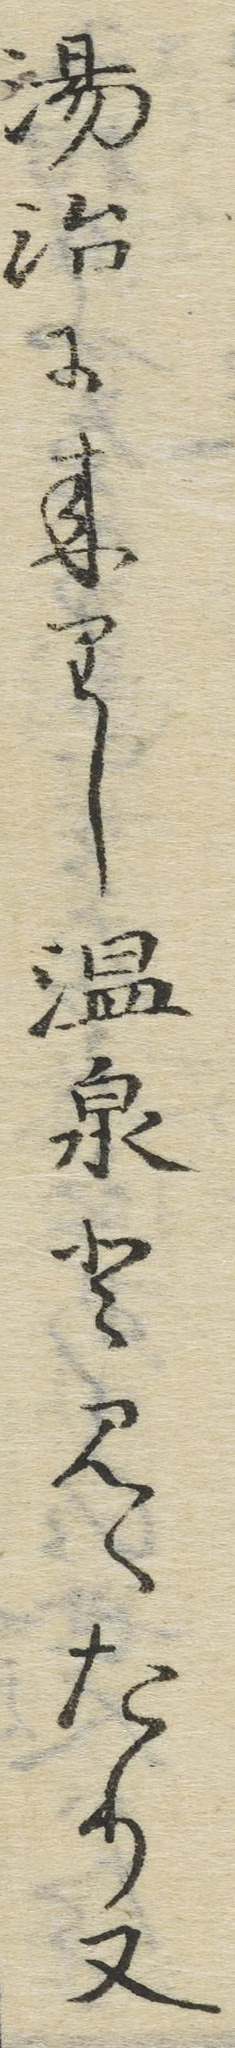湯治に来りし温泉と見へたり又
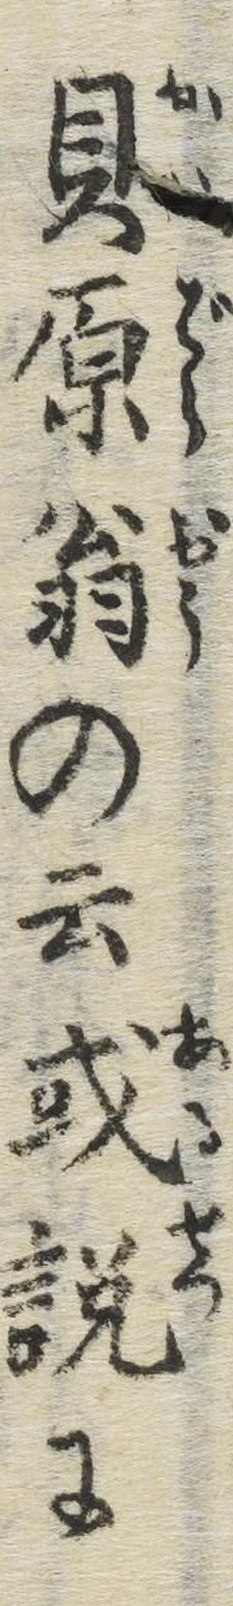貝原翁の云或説に
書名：温泉考
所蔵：東京大学地震研究所図書室 Earthquake Research Institute Library, The University of Tokyo, JAPAN
